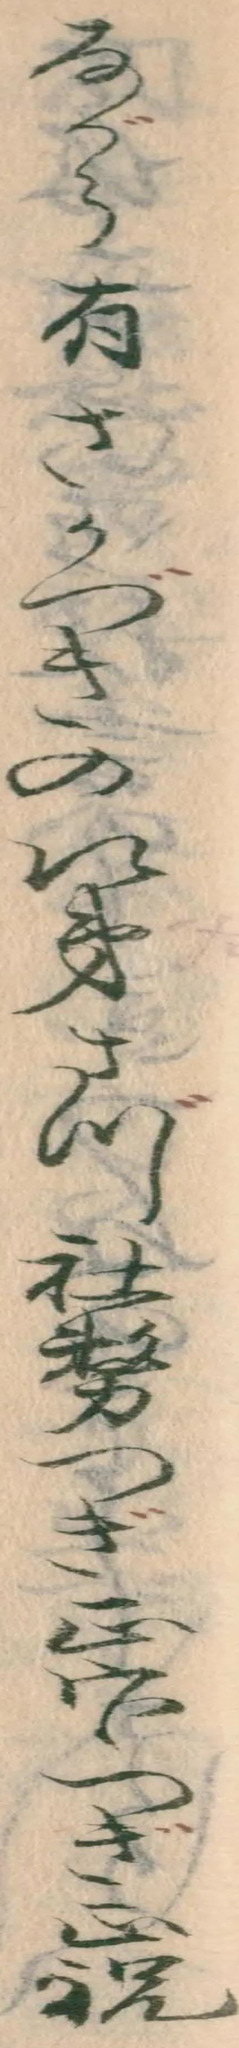ながら有さかづきの次第まづ社務つぎ正官つぎ正祝
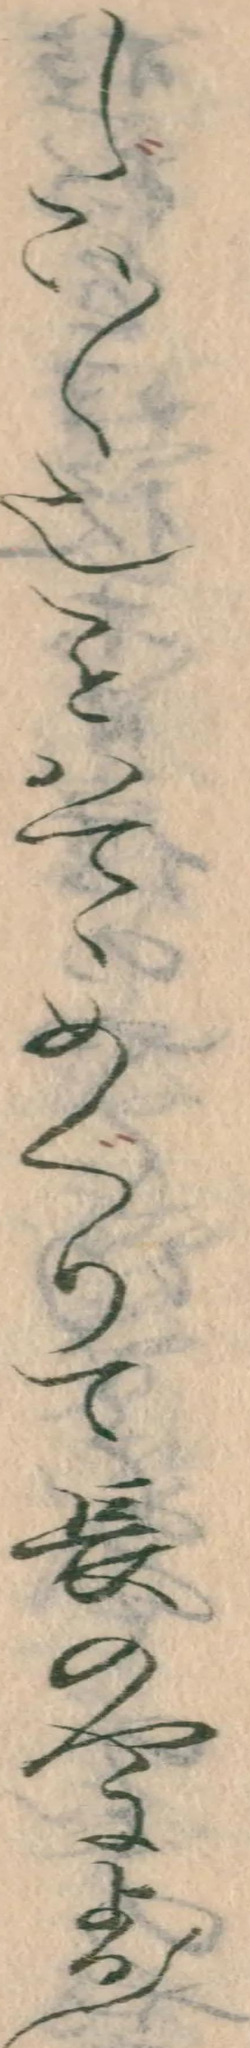しだい〳〵也ことはてゝめぐりて長のやによる
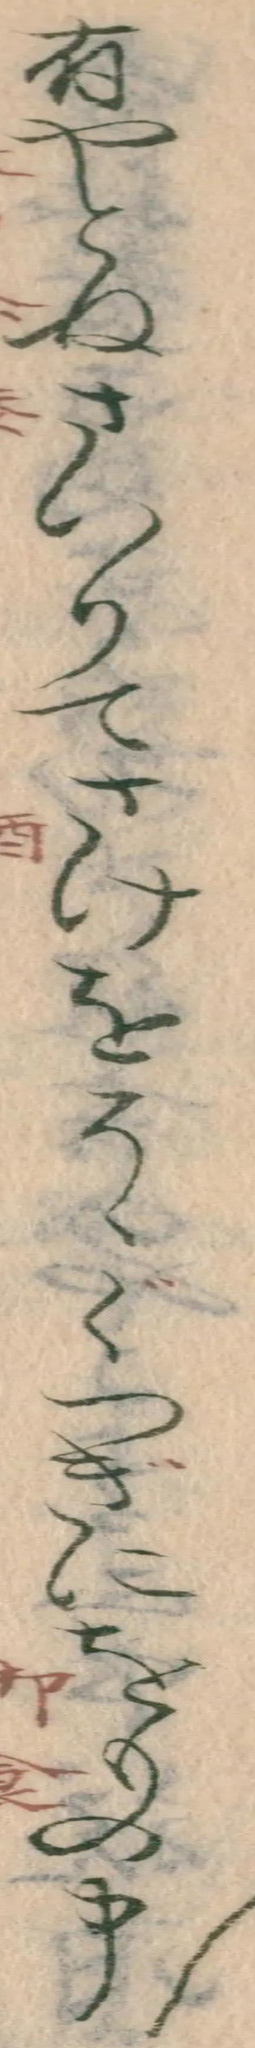有やとねまいりてさけをそゝぐつぎにをもの申
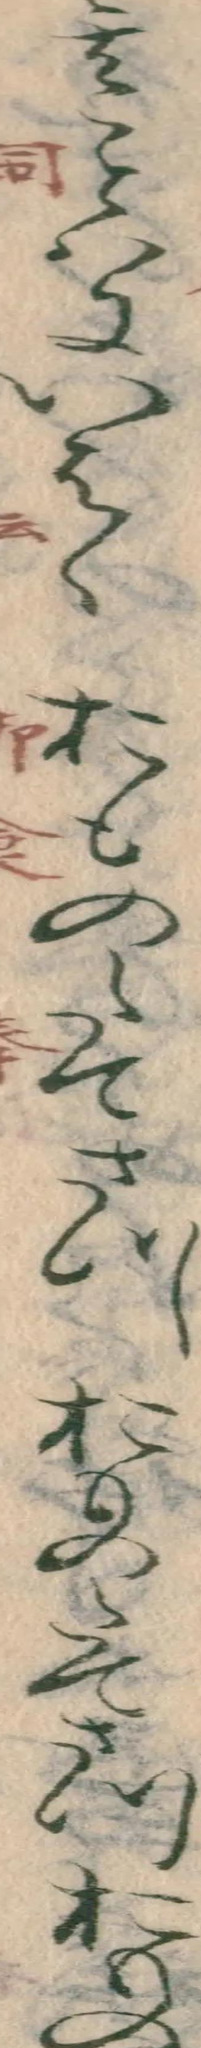其ことはにいはくおものたてまつおものたてまつおもの
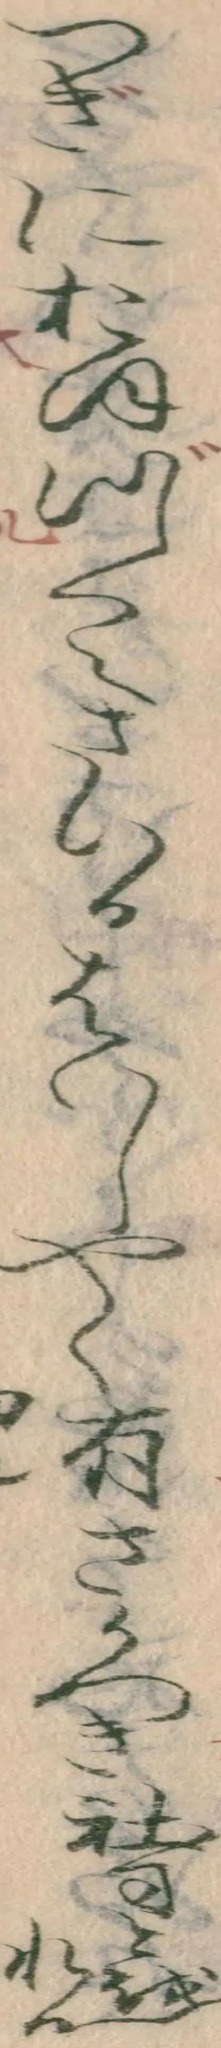つぎにおほづくえまいるはいしやく有さかつき社司とをれる
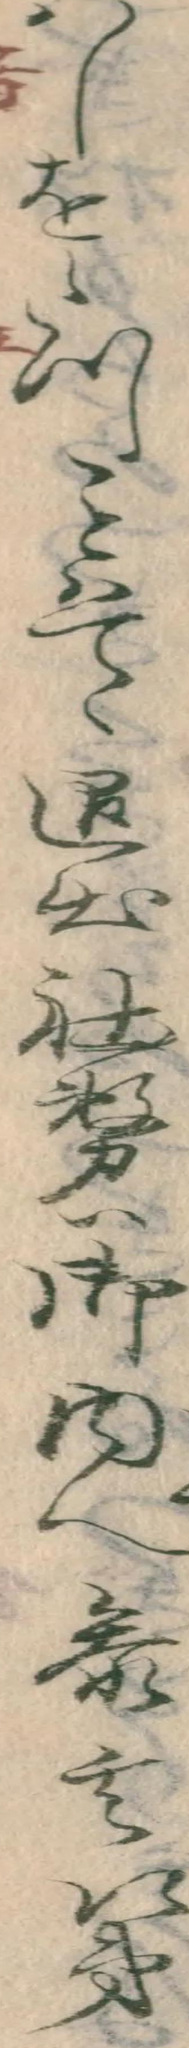はしをたつことはてゝ退出社務は御内へ参其次第
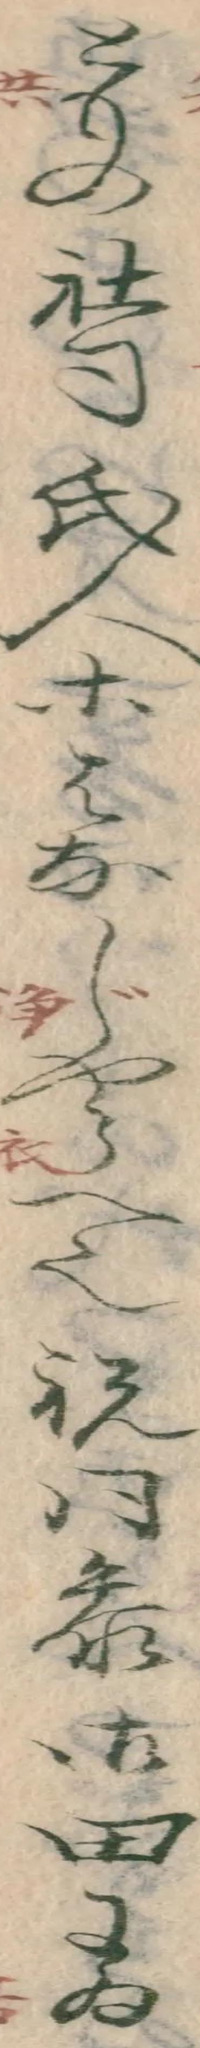ともの社司氏人等はなじやうへ也祝同参御田にゐ
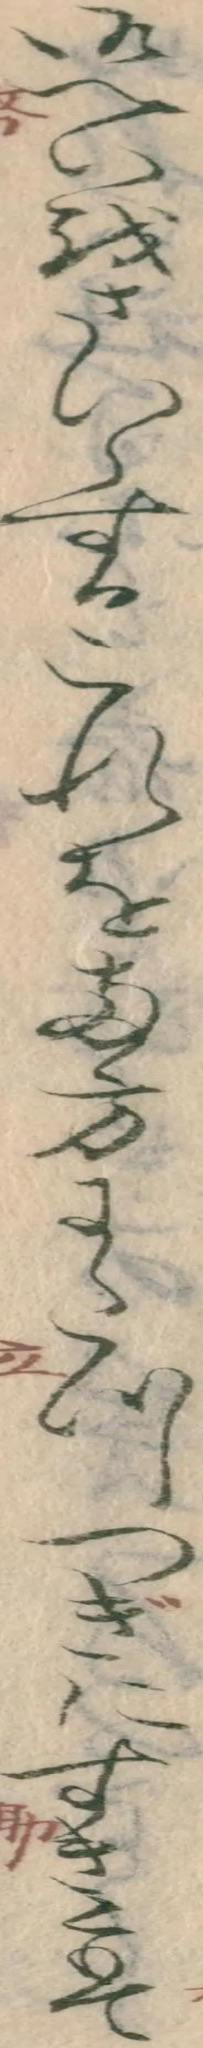御へいをまいらするこれを両方にたつつぎにすきとりて
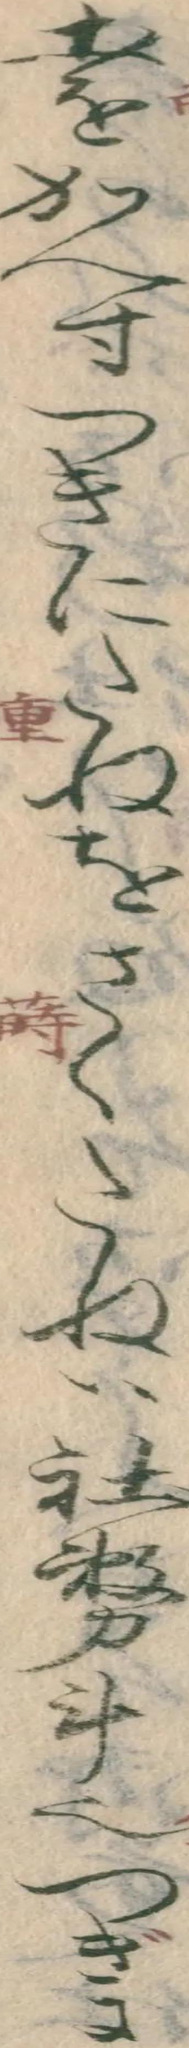土をかへすつきにたねをまくたねは社務計也つぎに
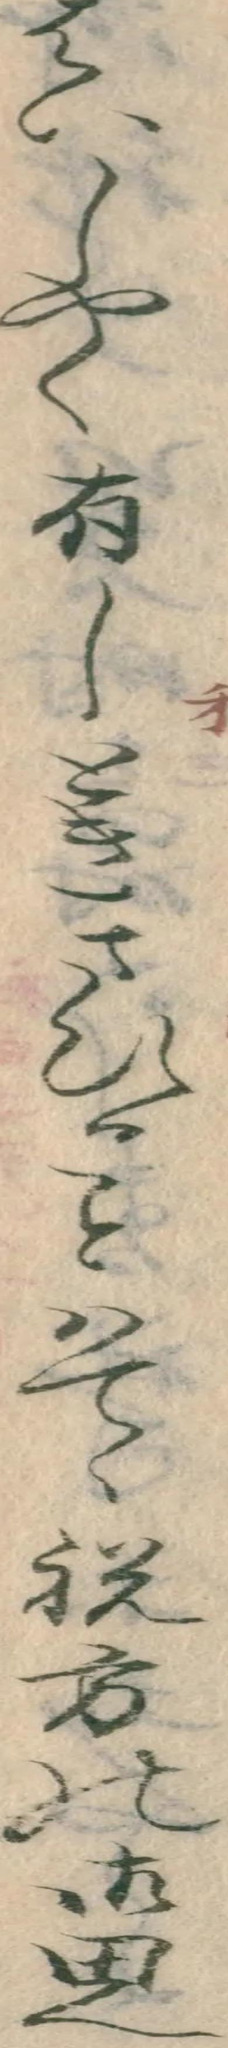はいしやく有しときまひることはてゝ祝方の御田へ
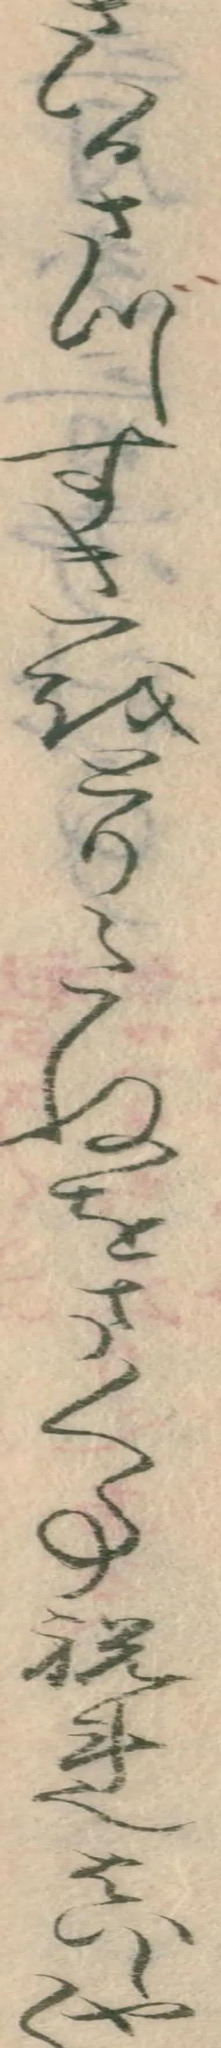まいるまづすきをとりたねをまく事祝計也はいしやく
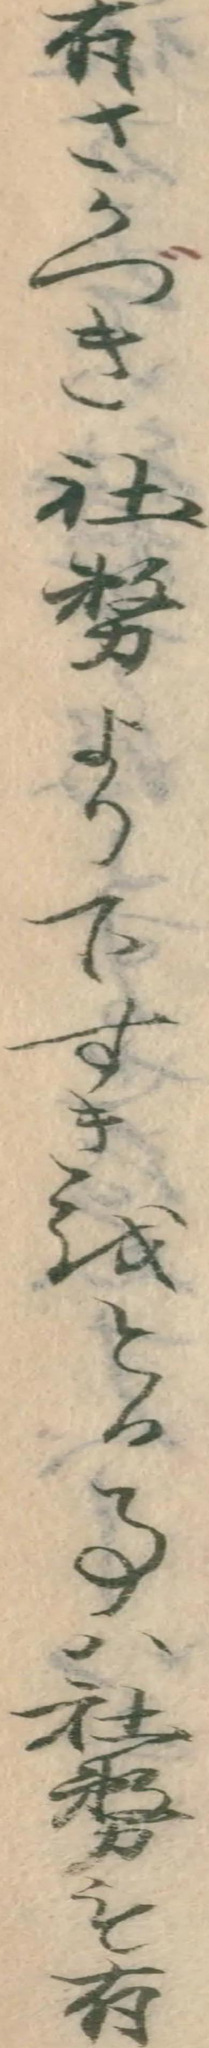有さかづき社務より下すきをとる事は社務も有

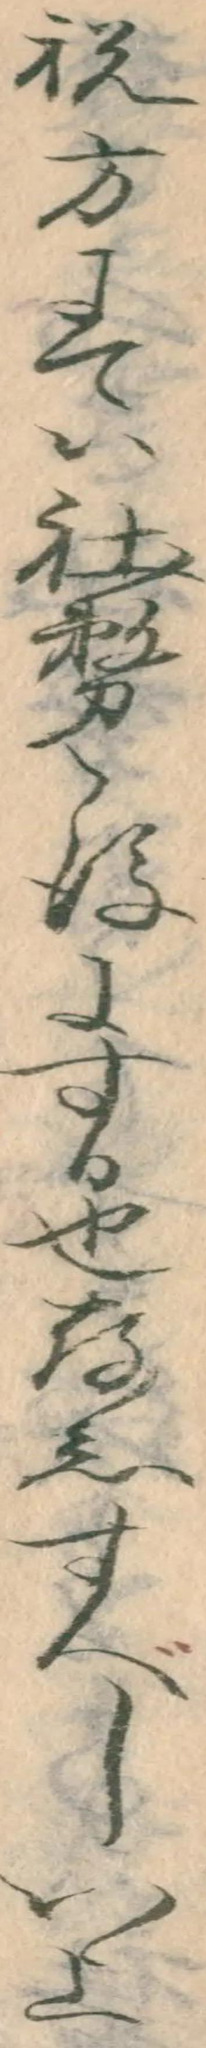祝方にては社務之後にする也存知すべし以上
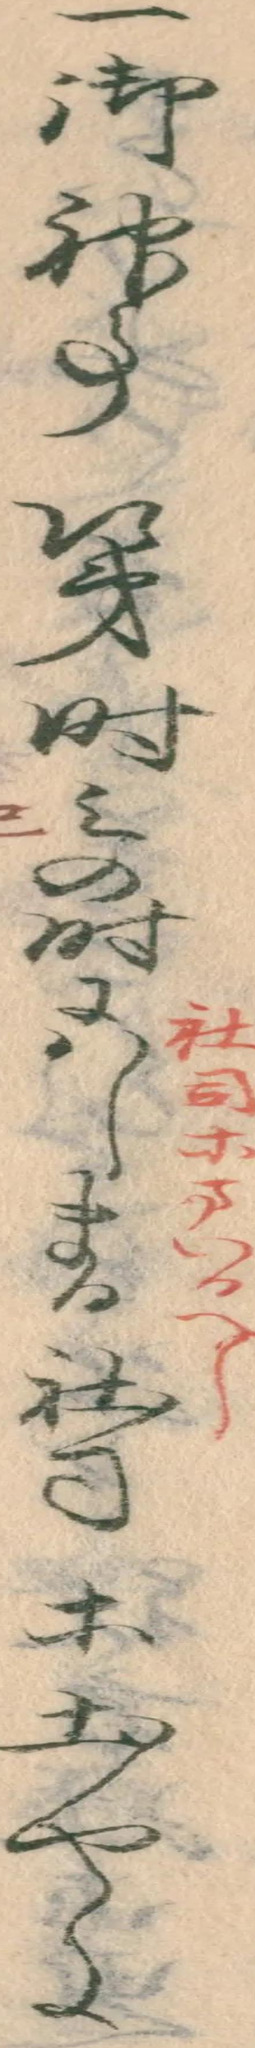一御神事次第時みの時にはしまる社司等土やに
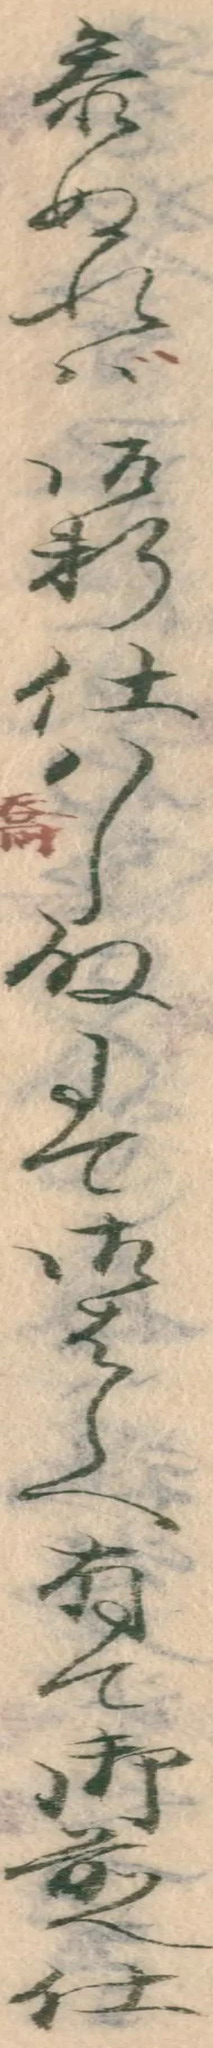参ぬれば御料仕はし殿にて御はらへ有て御前へ仕
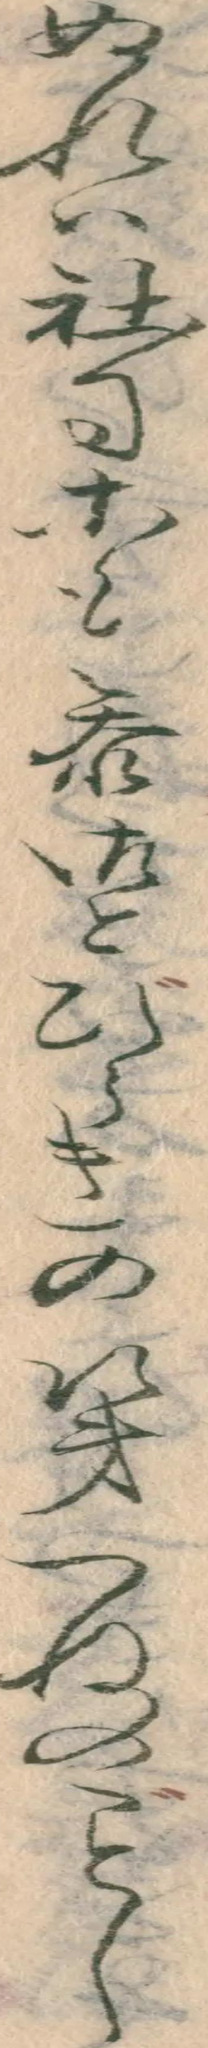ぬれは社司等も参御とびらきの次第つねのごとし
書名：賀茂社記録. 第3冊
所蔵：国立国会図書館 National Diet Library, JAPAN
